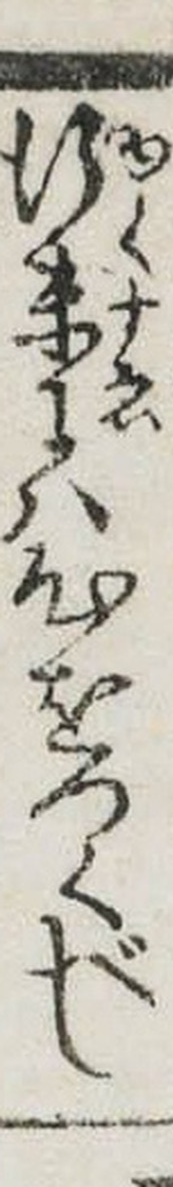行末には心をつくべし
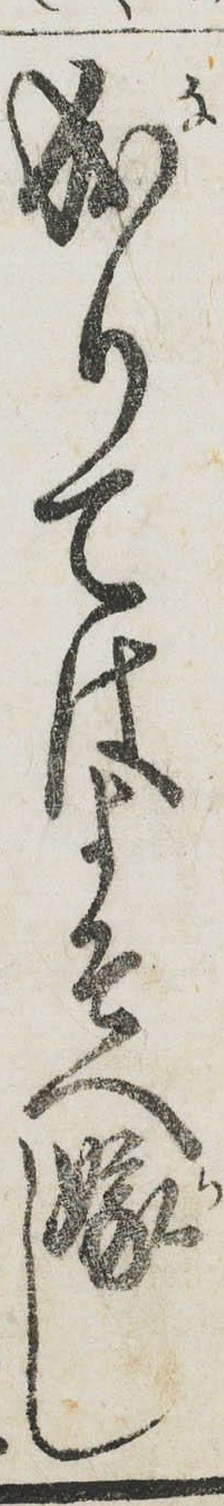成りてはよそへ嫁し
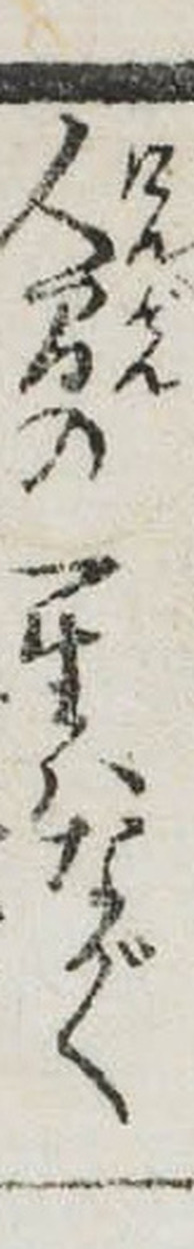人間の一生はながく
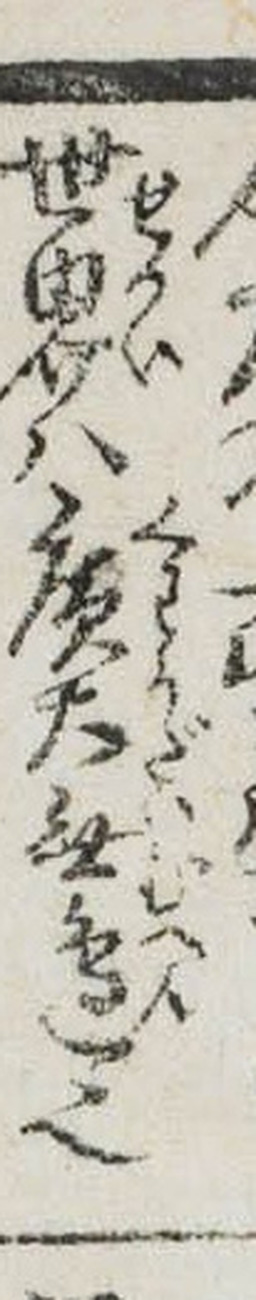世界は広大無辺也
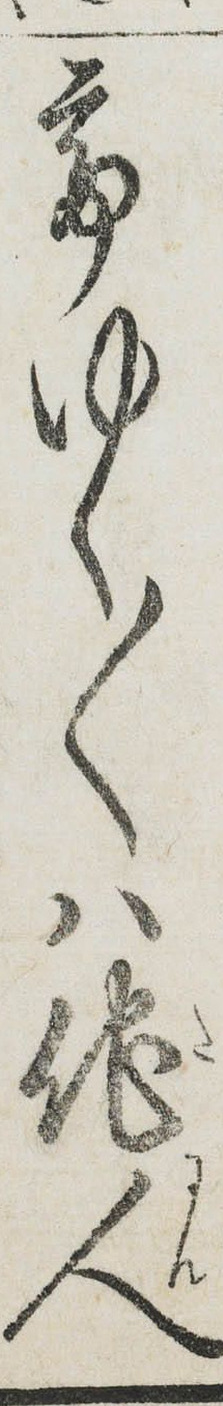てゆく〳〵は他人
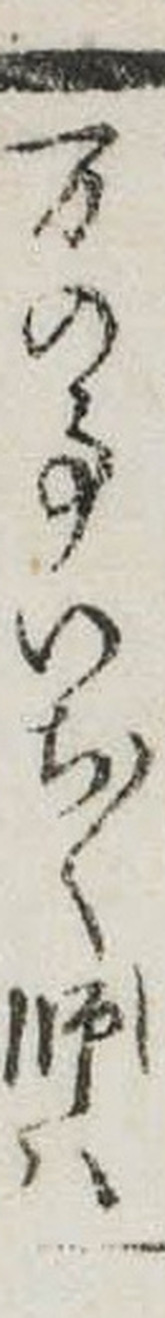万の事いち〳〵師は
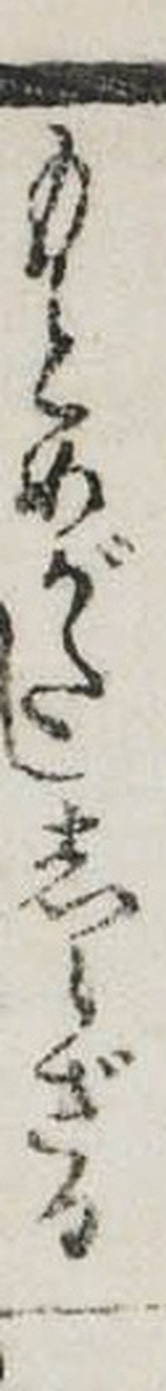もとめがたししらざる
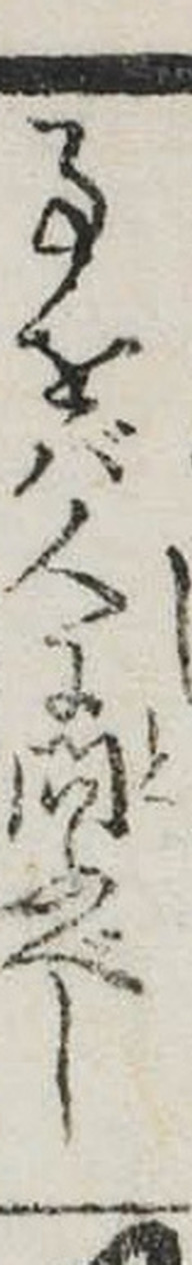事をば人に問ふべし
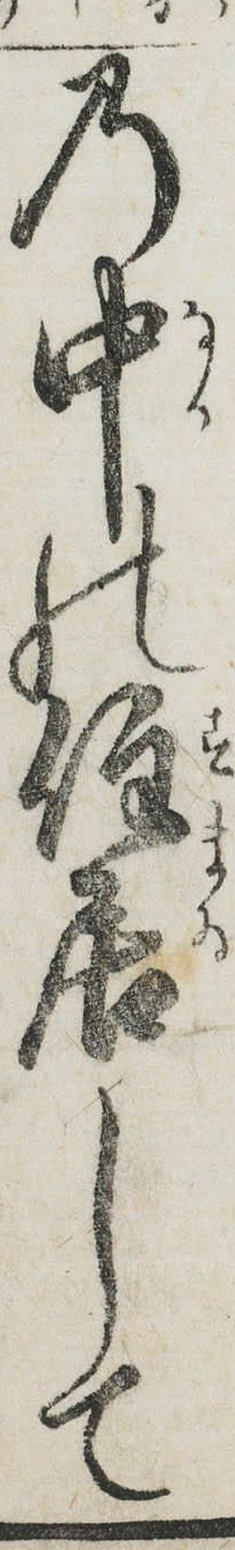の中の住居して
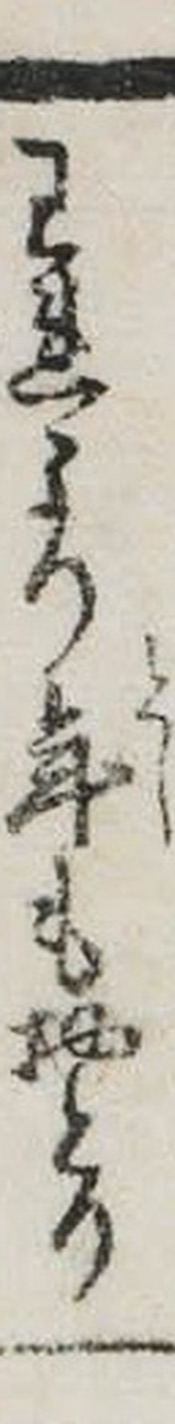われより年もおとり
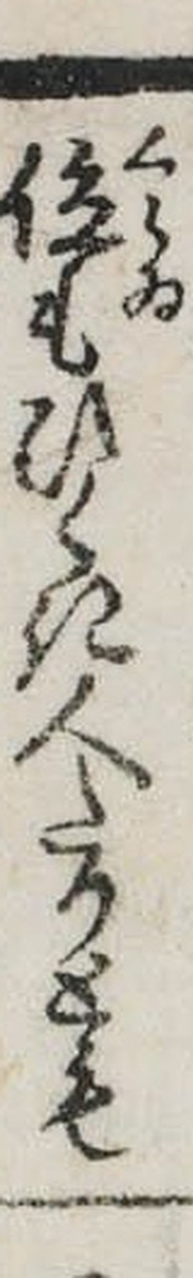位もひくき人たりとも
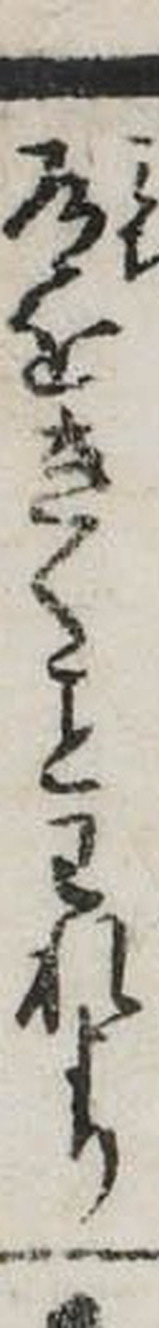道をきくことわれより
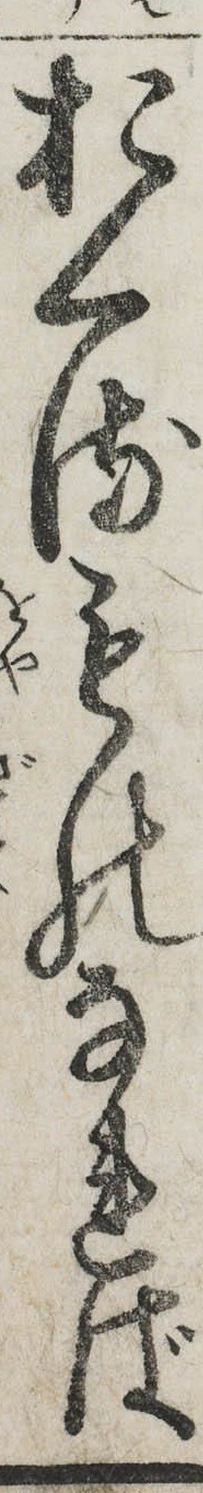おくるものなれば
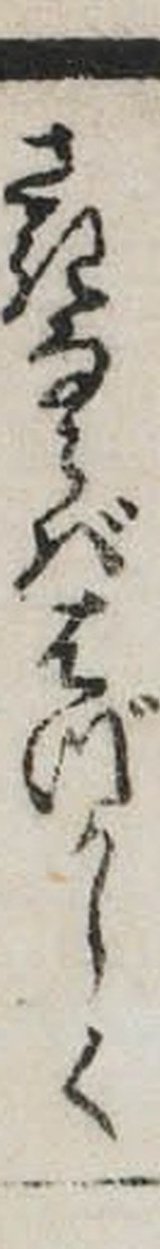さきならばはづかしく
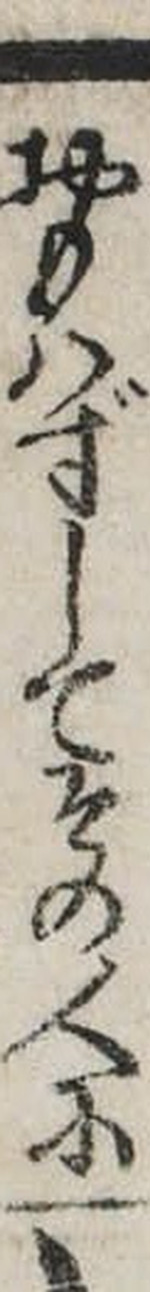おもはずしてその人に
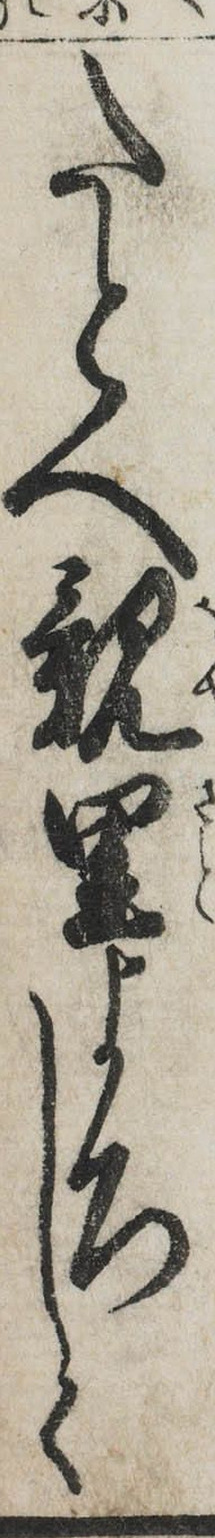たとへ親里よろしく
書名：頭書萬用婦人手紙之文言
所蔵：東京学芸大学教育コンテンツアーカイブ
